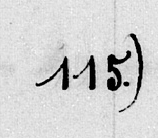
116.)
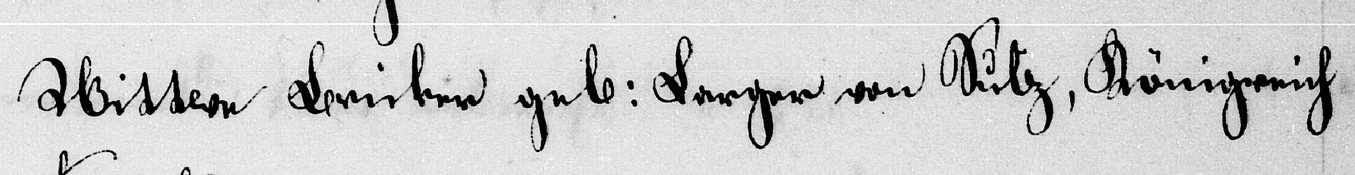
Wittwe Bricker geb: Larger von Sulz, Königreich
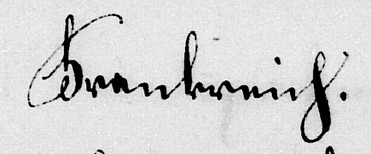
Frankreich.
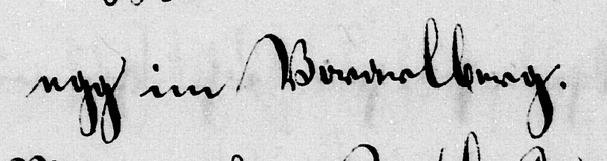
egg im Vorarlberg.
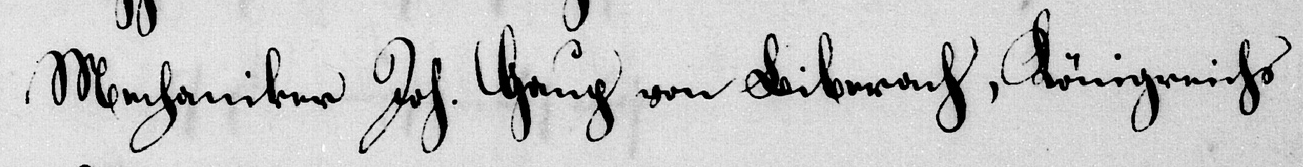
Mechaniker Joh. Gaup von Biberach, Königreichs
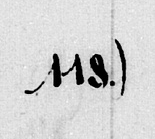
118.)
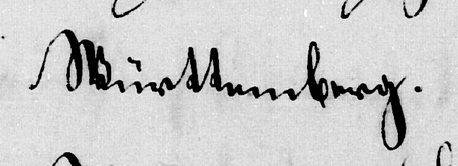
Württemberg.
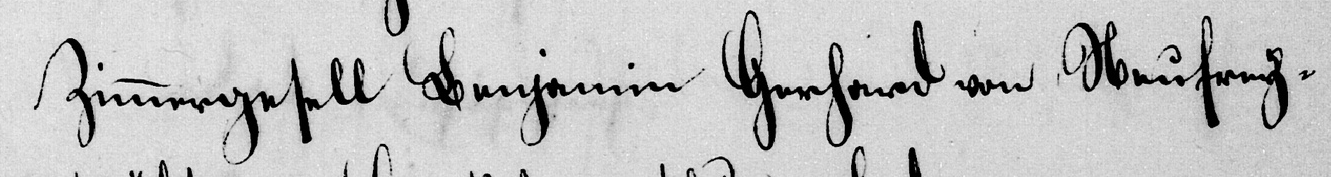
Zimmergesell Benjamin Gerhard von Neufrey¬
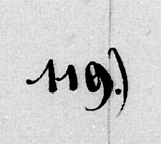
119.)
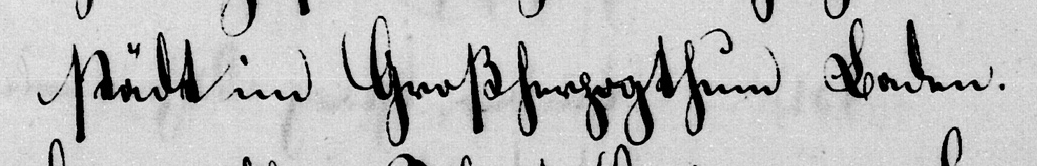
städt im Großherzogthum Baden.
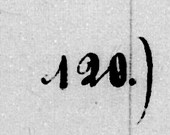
120.)
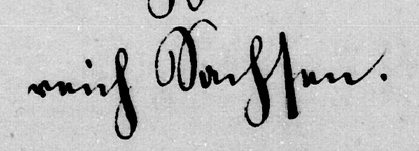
reich Sachsen.
